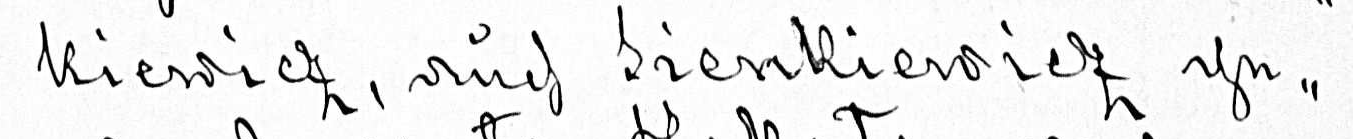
kiewicz, auch Sienkiewicz ge¬
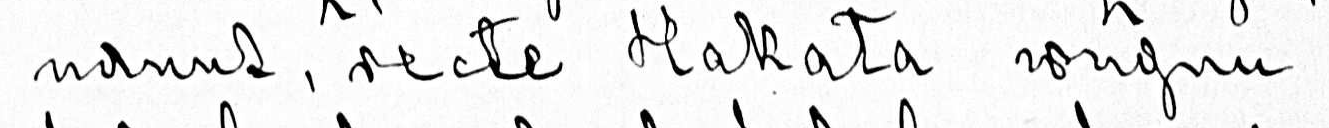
nannt, recte Hakała wegen
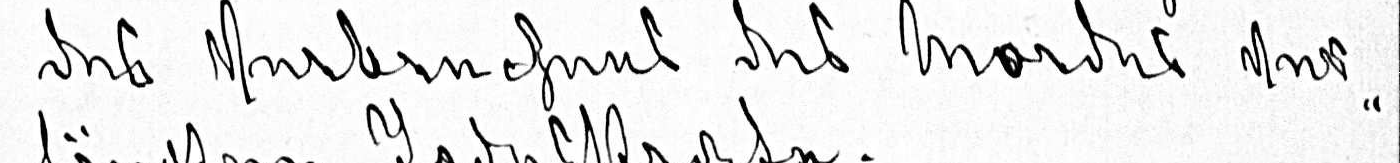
des Verbrechens des Mordes ver¬
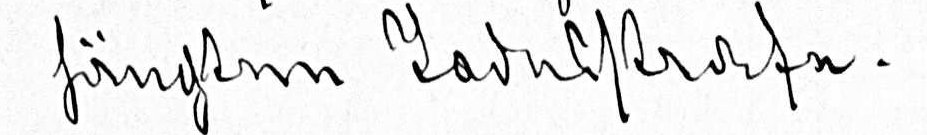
hängten Todesstrafe.
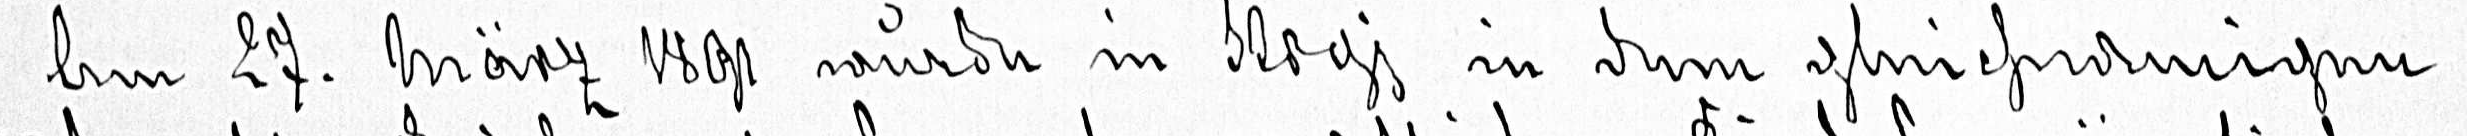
Am 27. März 1891 wurde in Stryj in dem gleichnamigen
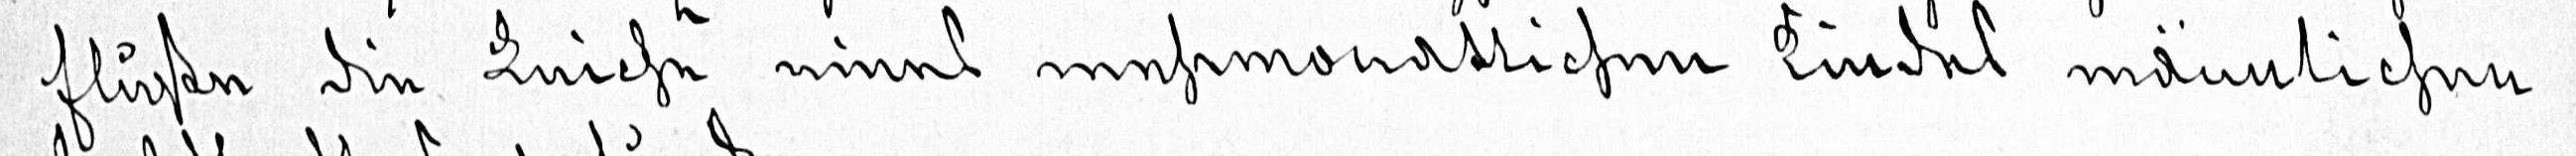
Fluße die Leiche eines mehrmonatlichen Kindes männlichen
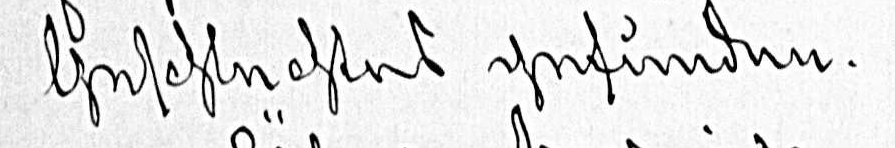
Geschlechtes gefunden.
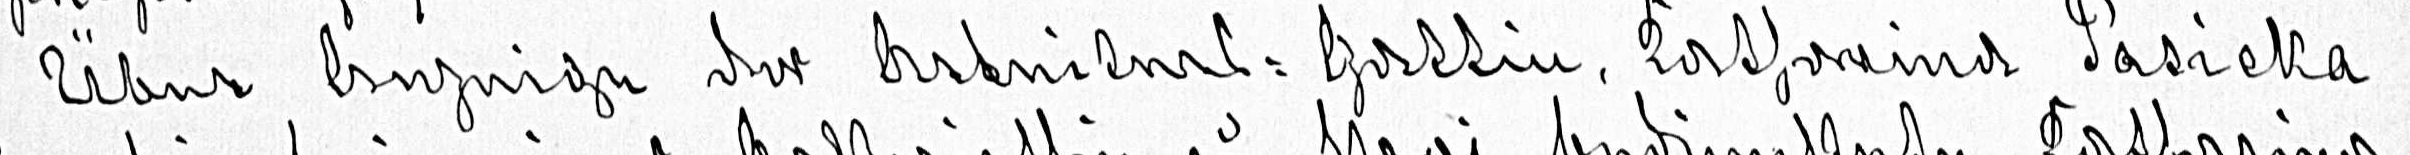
Über Anzeige der Arbeiters-Gattin, Katharina Pasieka
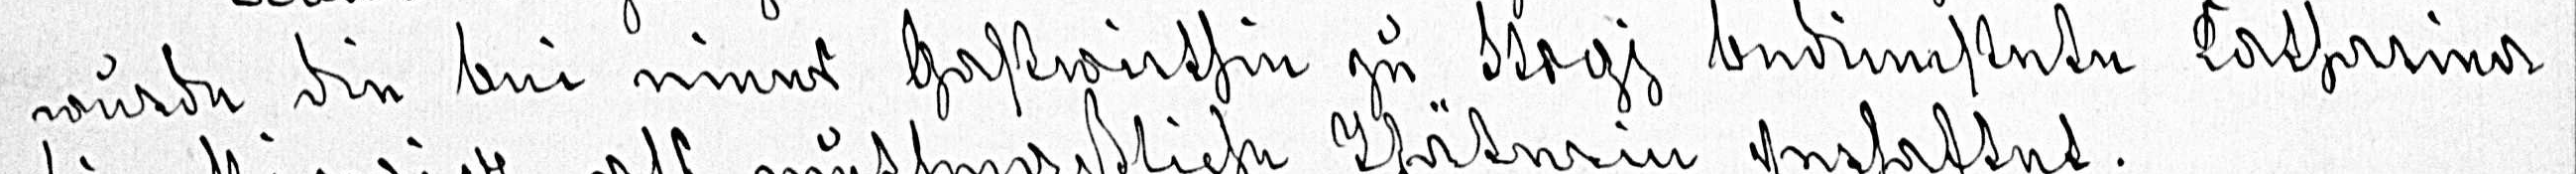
wurde die bei einer Gastwirthin zu Stryj bedienstete Katharina
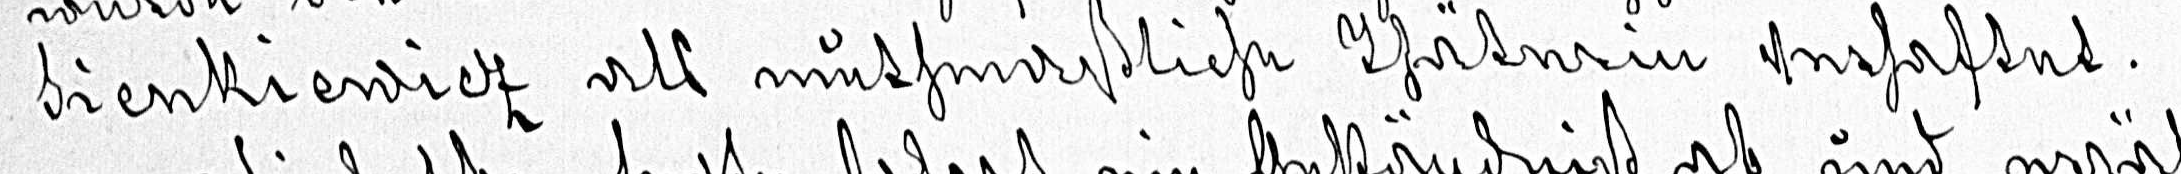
Sienkiewicz als muthmaßliche Thäterin verhaftet.
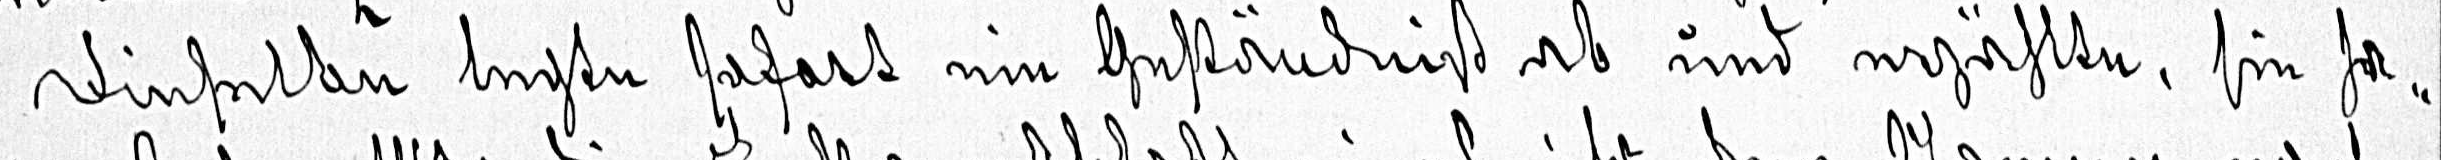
Dieselbe legte sofort ein Geständniß ab und erzählte, sie ha¬
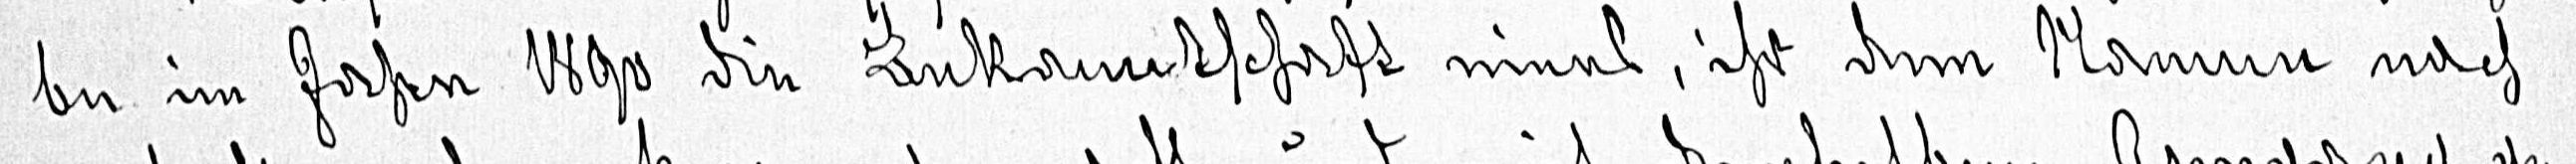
be im Jahre 1890 die Bekanntschaft eines, ihr dem Namen nach
